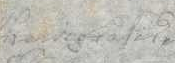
Hochgeachteter
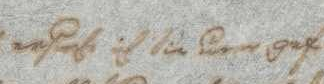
ersuche ich Sie um gef.
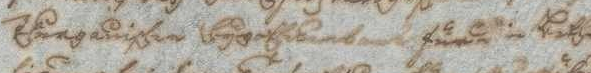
Thurgauischen Hypothekenbank für die Bethei-
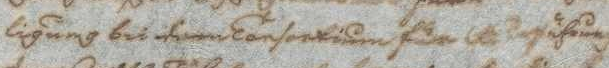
ligung bei dem Consortium für Ausführung
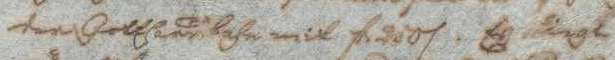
der Gotthardbahn mit Fr. 250/m. Es liegt
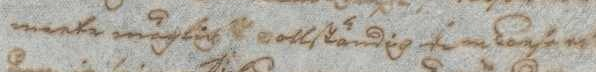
mente möglichst vollständig dem Consorti-
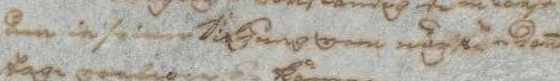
um in seiner Sitzung vom nächsten Donner-
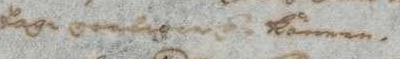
stage vorlegen zu können.
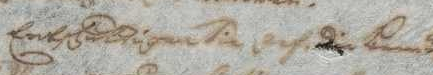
Entschuldigen Sie gef. die Bemühung,
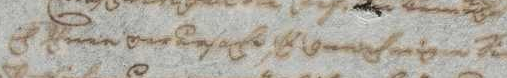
ich Ihnen verursache, & genehmigen Sie
